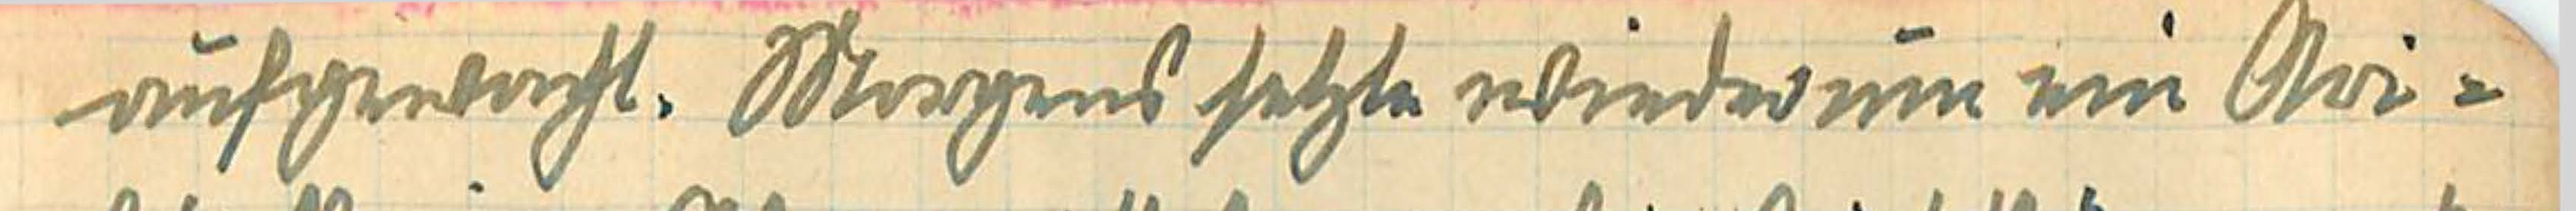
aufgewacht. Morgens setzte wiederum ein Ari-
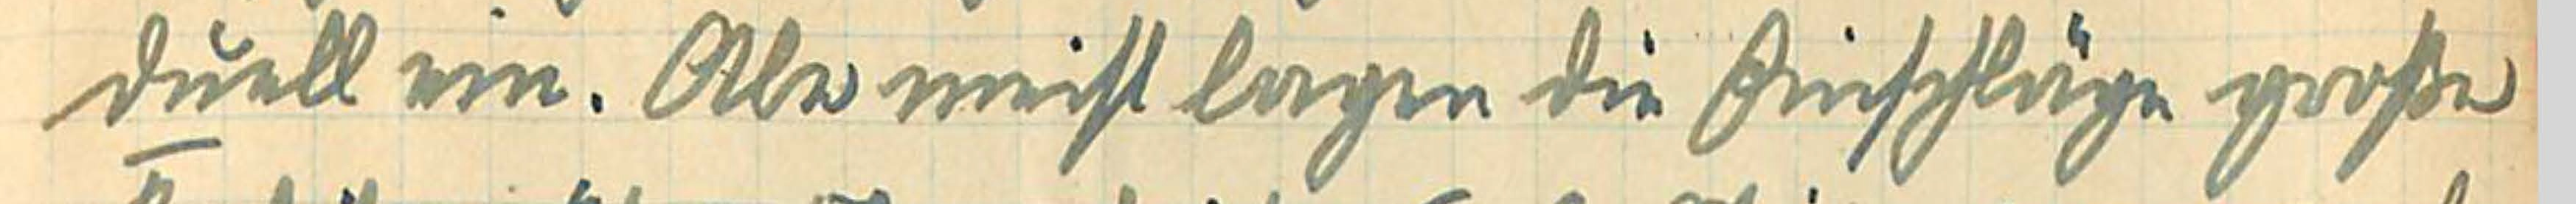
duell ein. Aber meist lagen die Einschläge großer
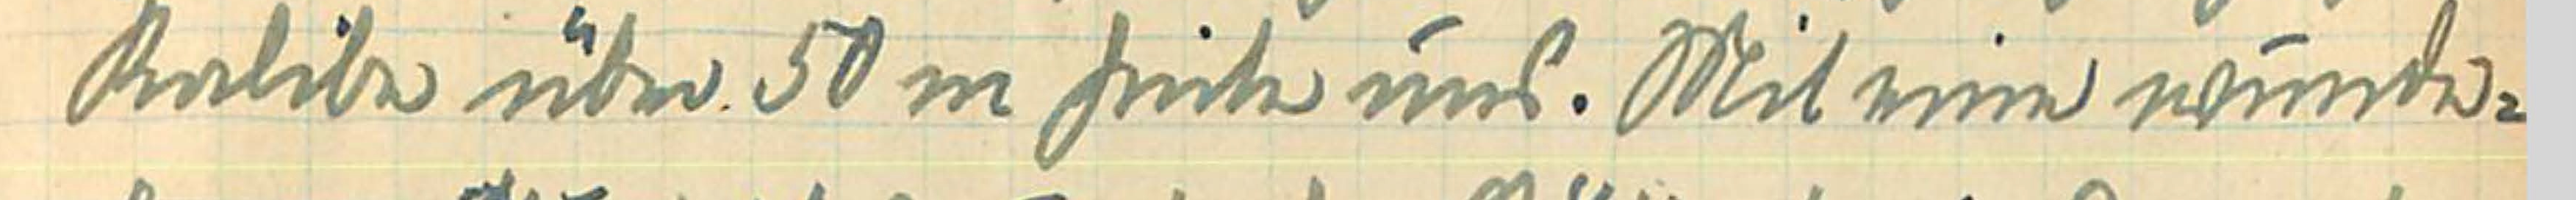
Kaliber über 50 m hinter uns. Mit einer wunder-
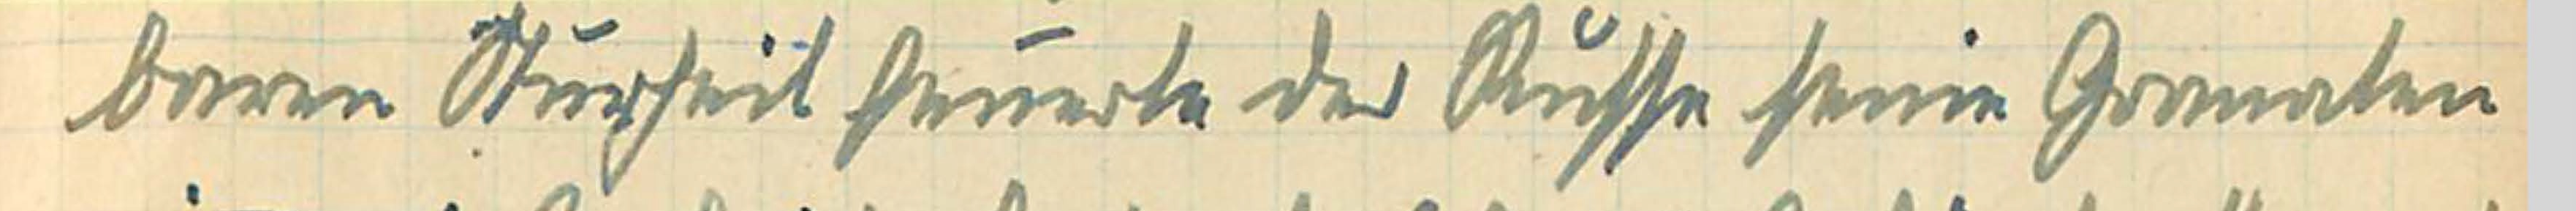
baren Sturheit feuerte der Russe seine Granaten
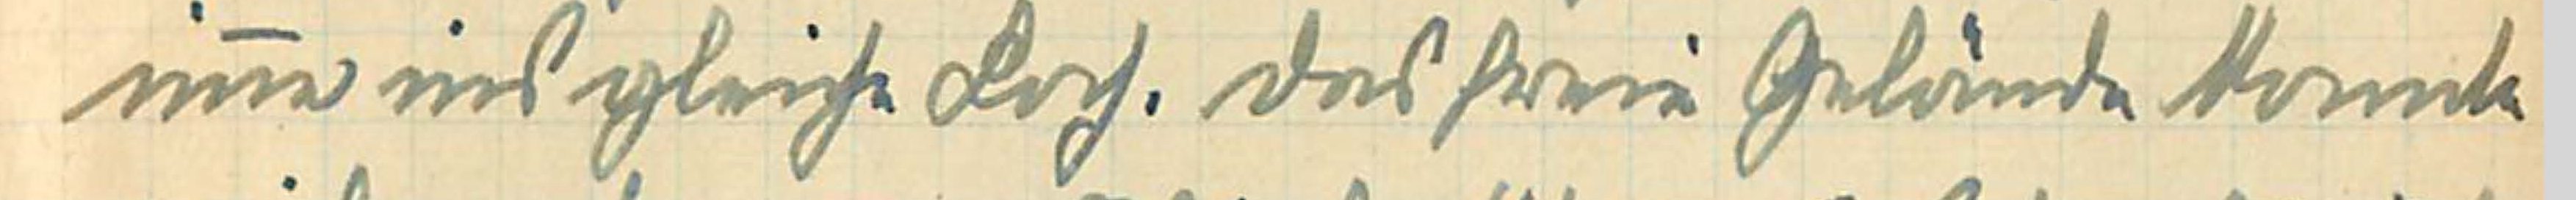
immer ins gleiche Loch. Das freie Gelände konnte
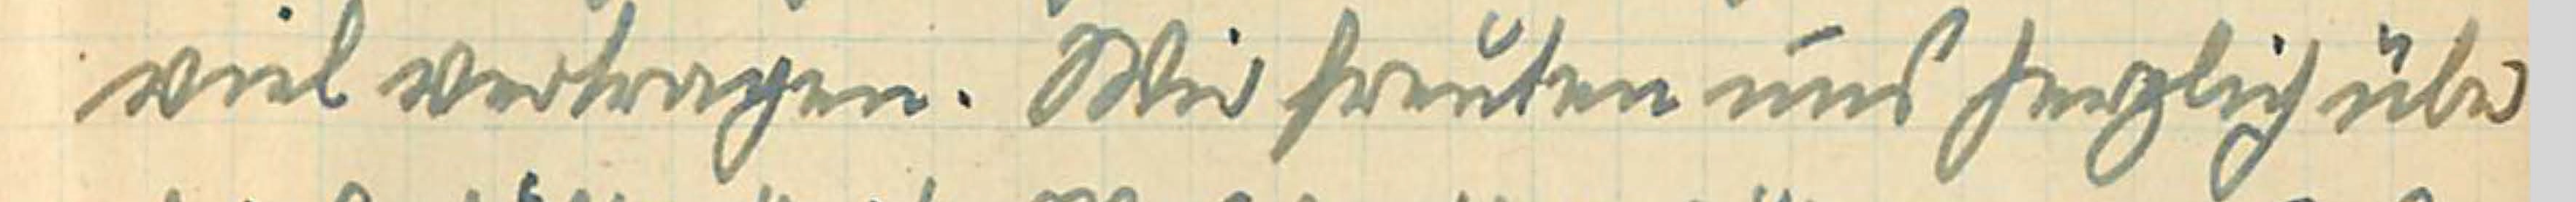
viel vertragen. Wir freuten uns herzlich über
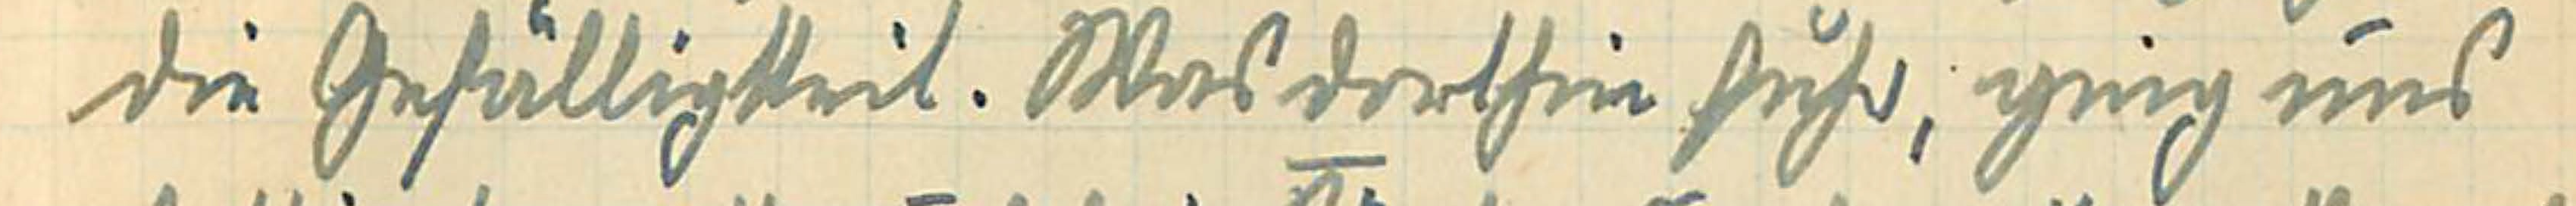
die Gefälligkeit. Was dorthin fuhr, ging uns
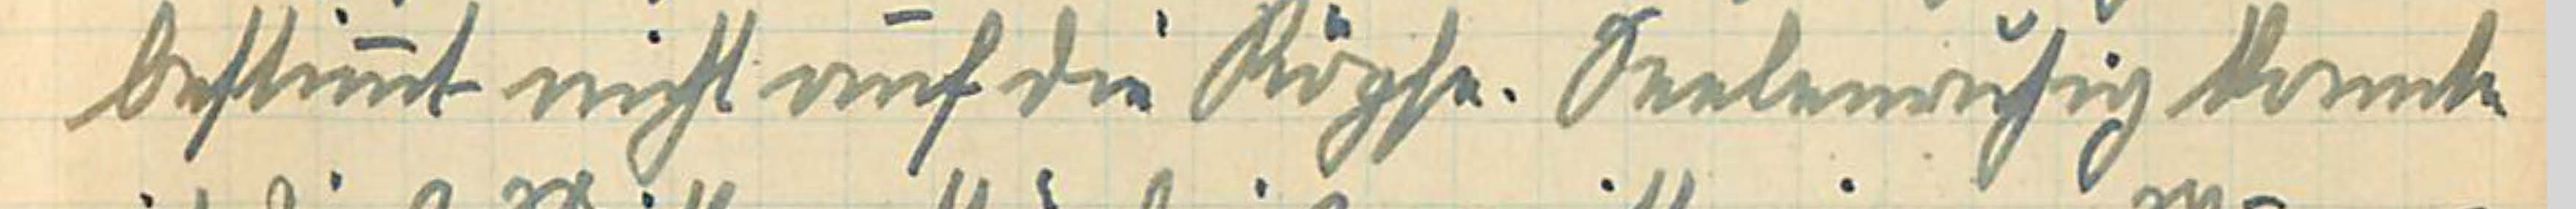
bestimmt nicht auf die Köpfe. Seelenruhig konnte
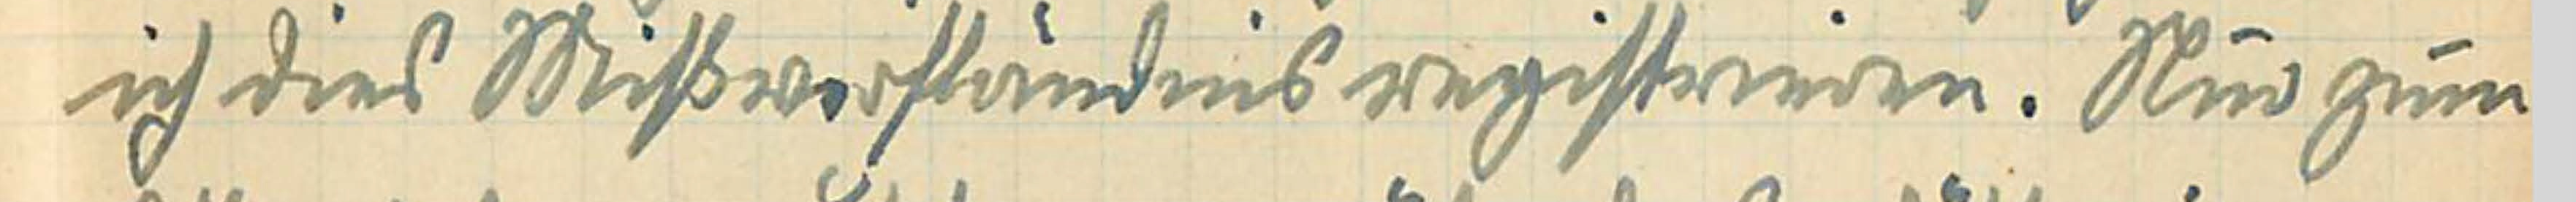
ich dies Mißverständnis registrieren. Nur zum
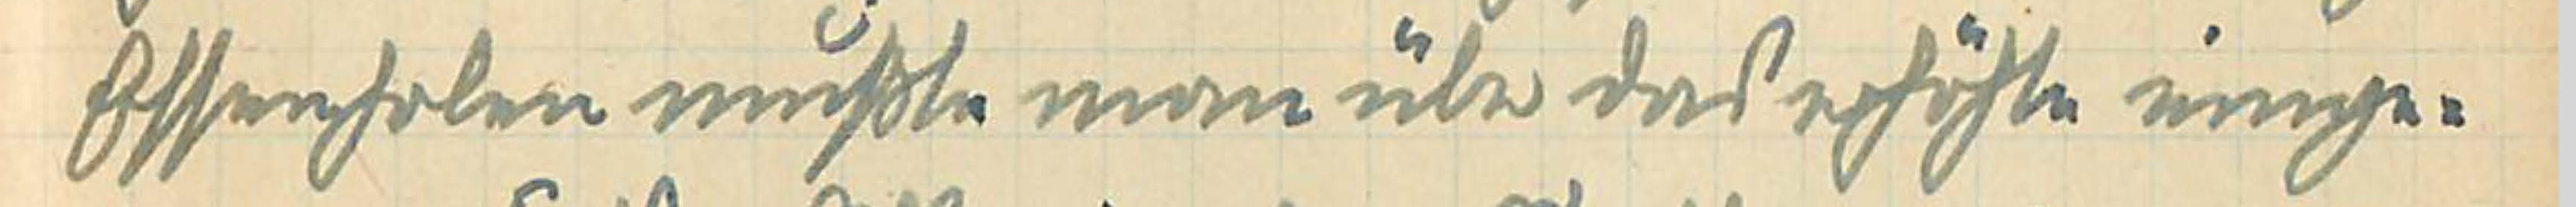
Essenholen mußte man über das erhöhte einge-
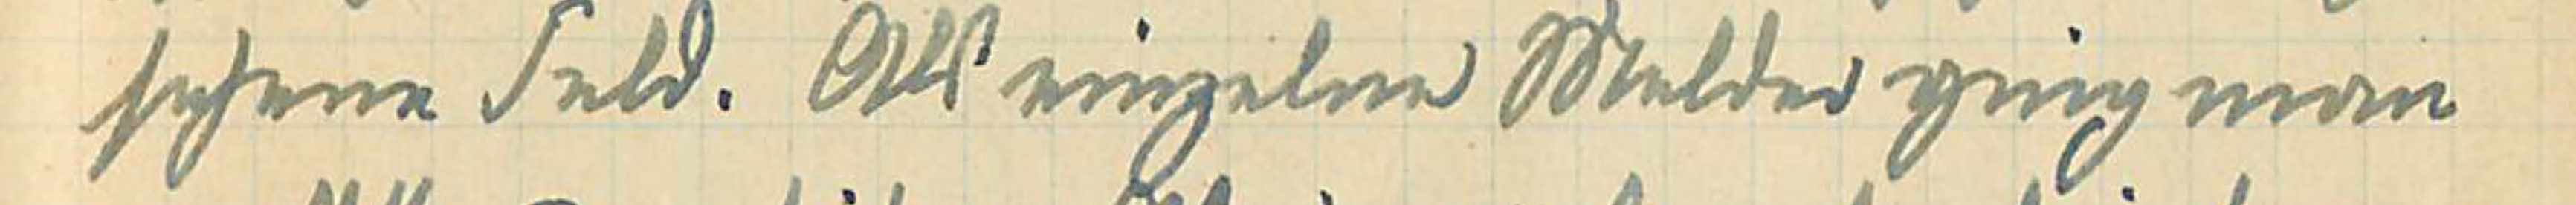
sehene Feld. Als einzelner Melder ging man
